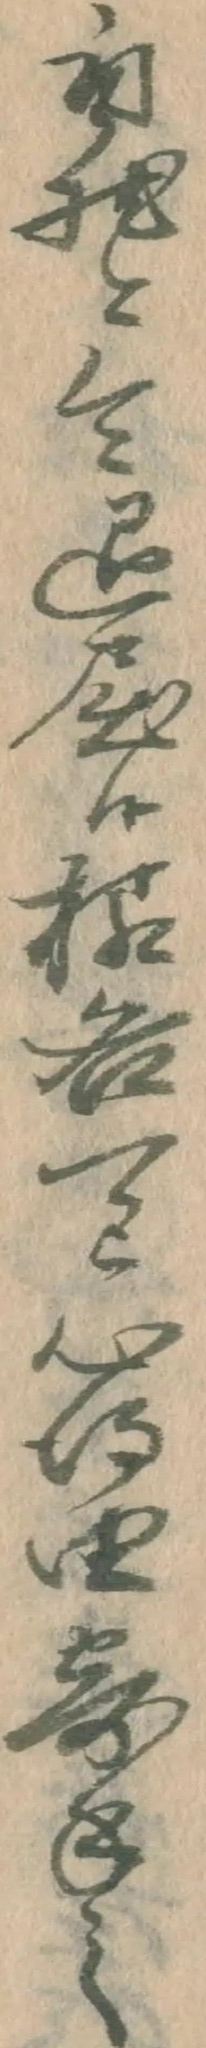自然と令退屈候様各可被心得由寄手之
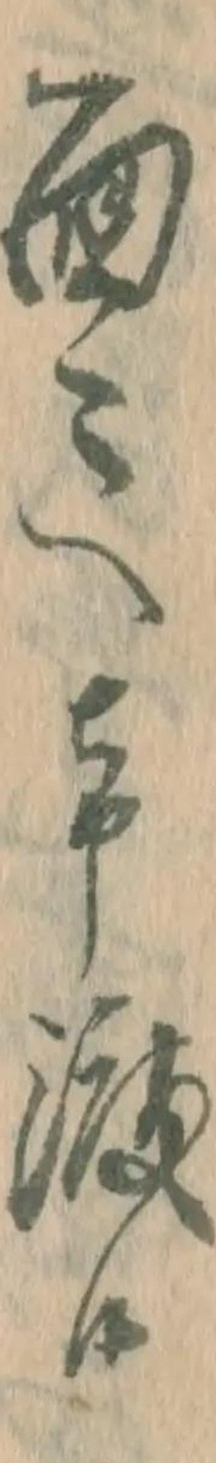面々へ被申渡候

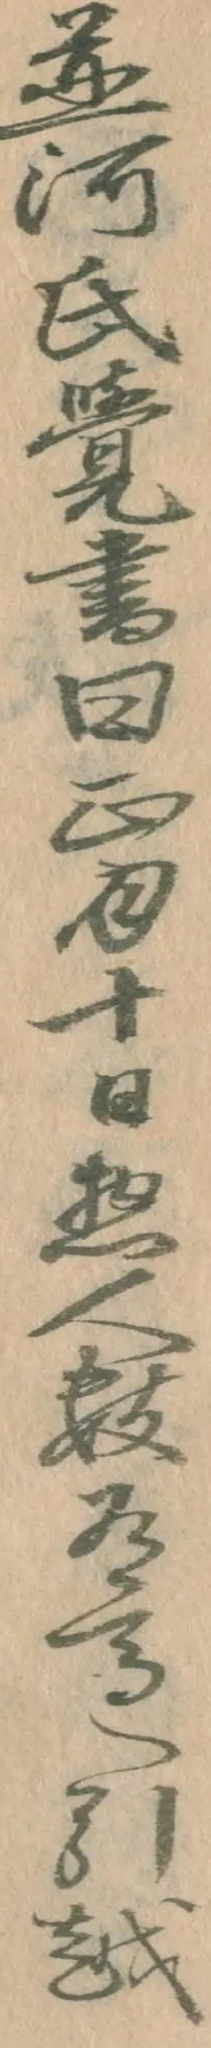並河氏覚書曰正月十日惣人数有馬へ引越
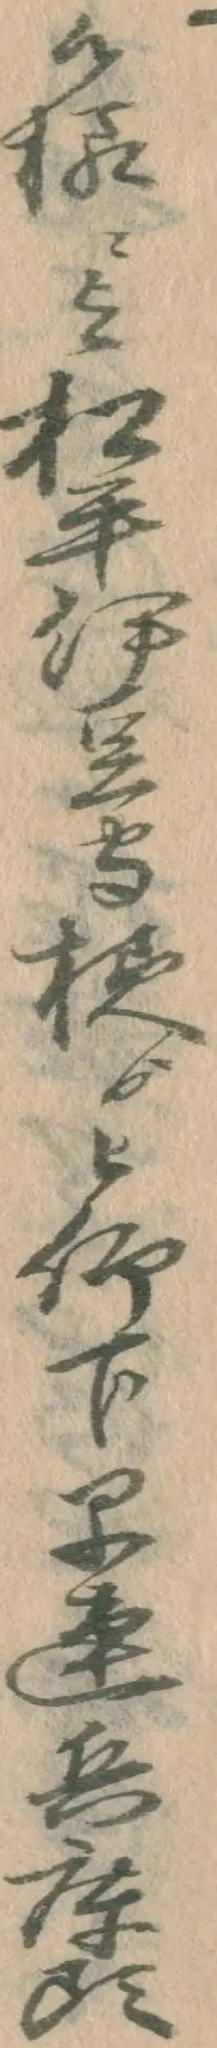候様に与松平伊豆守様ゟ被仰下早速兵庫頭
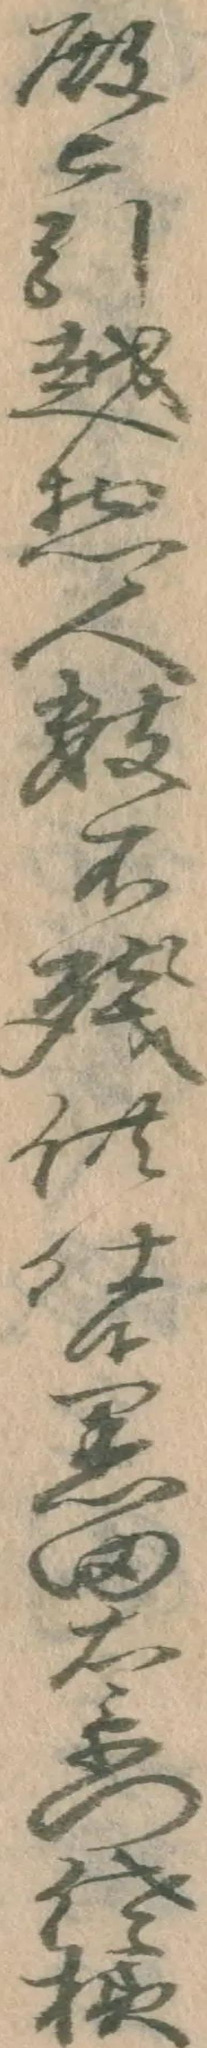殿被引越惣人数不残供仕候黒田右衛門佐様
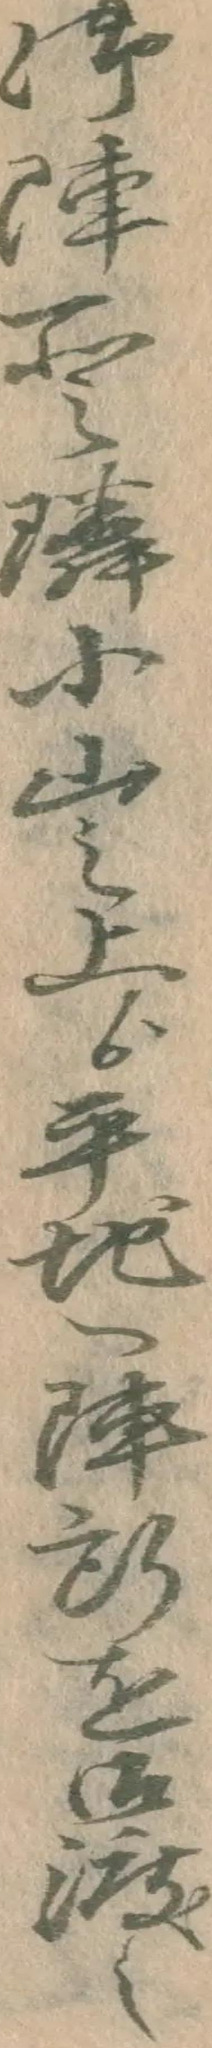御陣所之隣小山之上ゟ平地へ陣所を御渡し
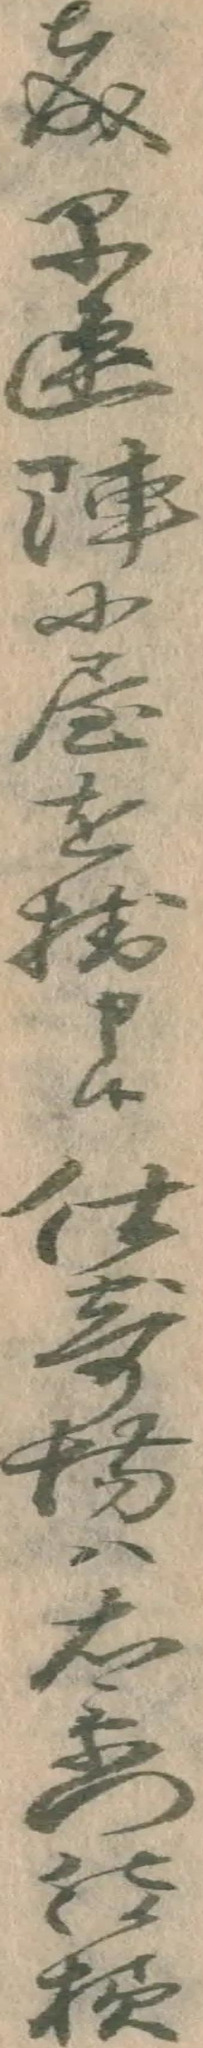被成早速陣小屋を掛申候仕寄場は右衛門佐様
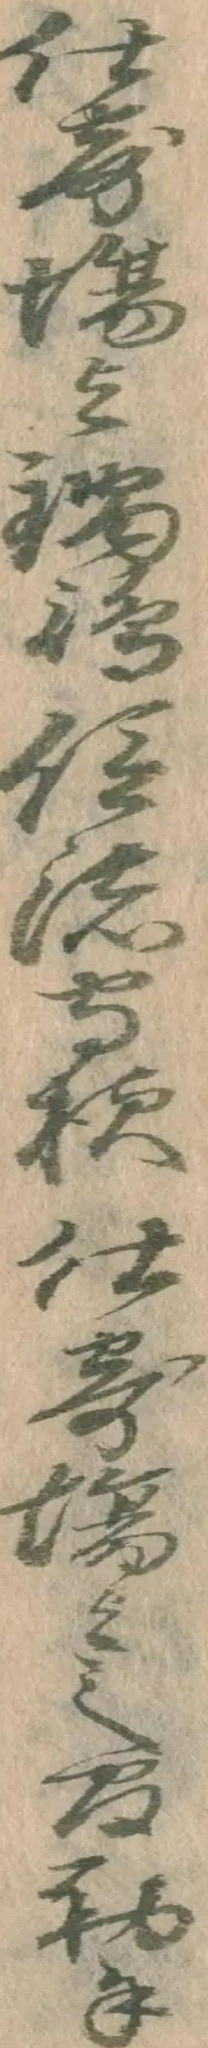仕寄場与鍋島信濃守様仕寄場与之間初手
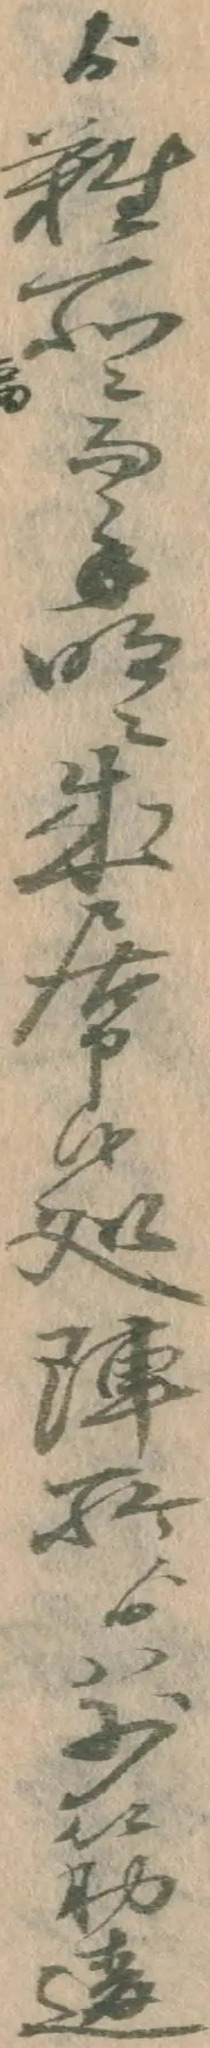ゟ難所に而手明に成居申候処陣所ゟは少筋違
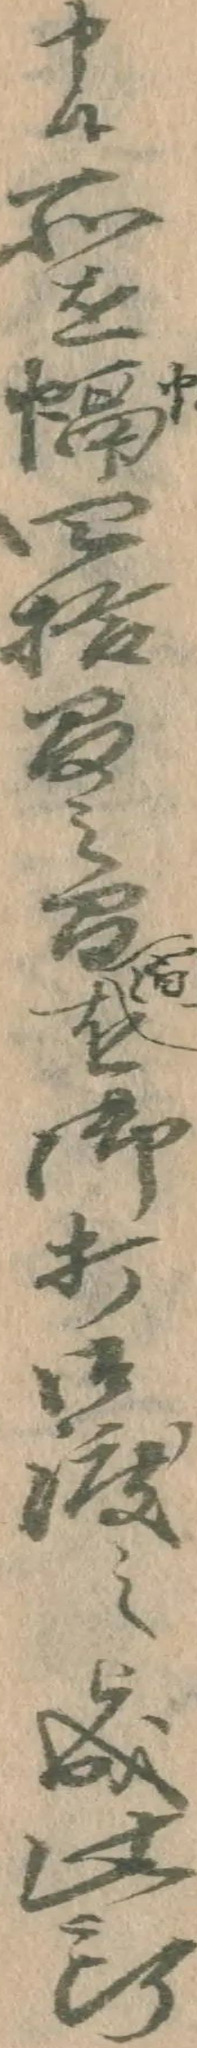申候所を幅四拾間之間間を御打御渡し被成此所
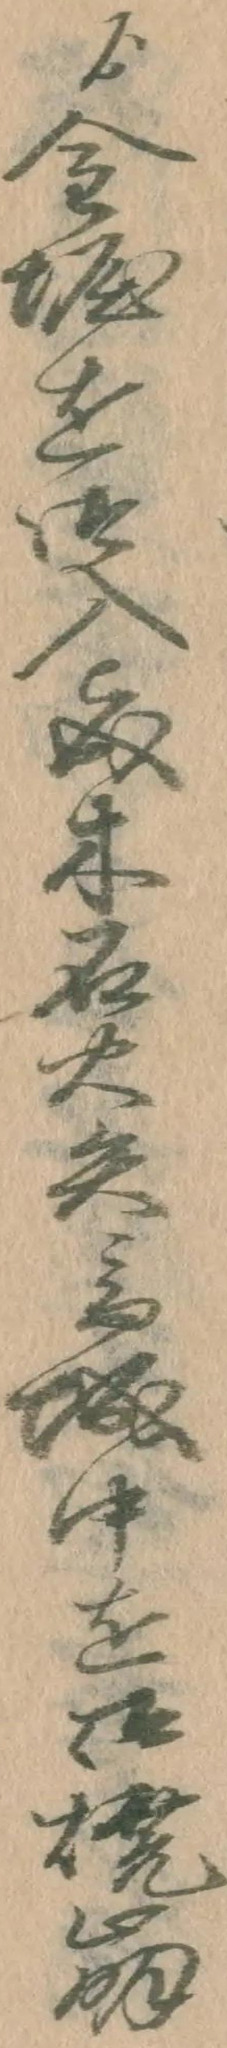ゟ金堀を御入被成木石火矢に而城中を御焼崩
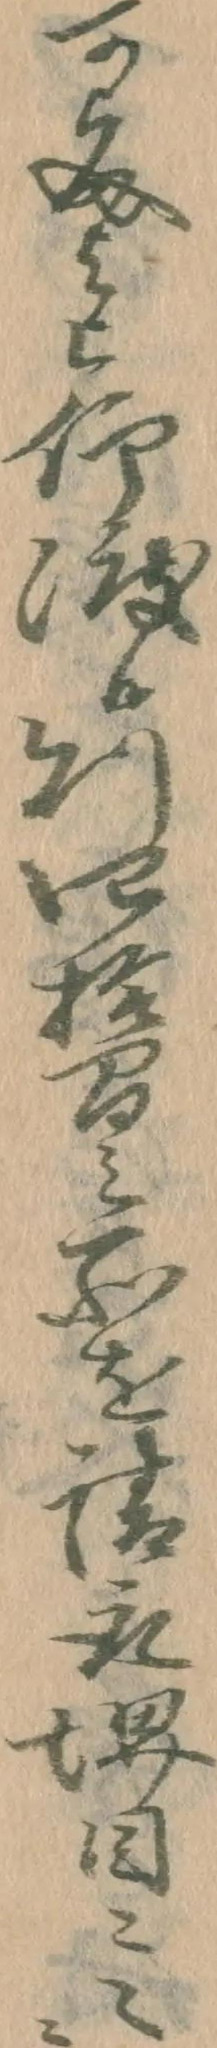可被成与被仰渡候則四拾間之所を請取堺目々々に
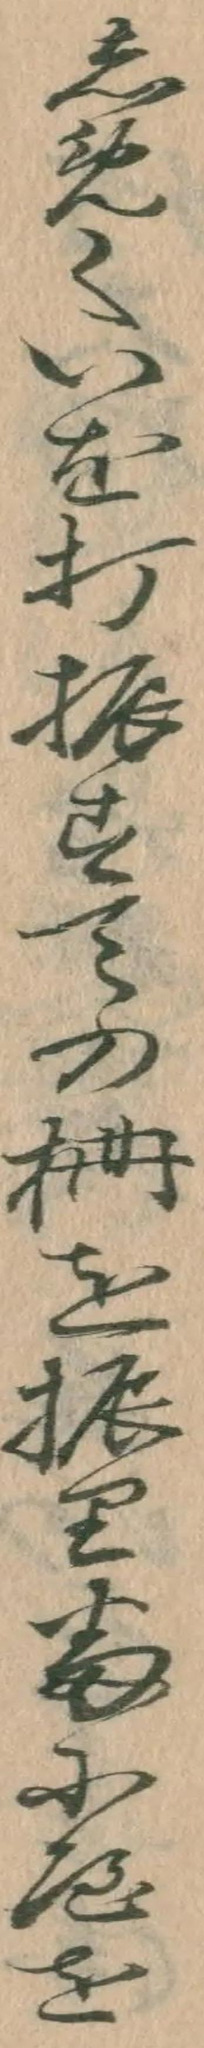志免くいを打振春ての柵を振里番小屋を
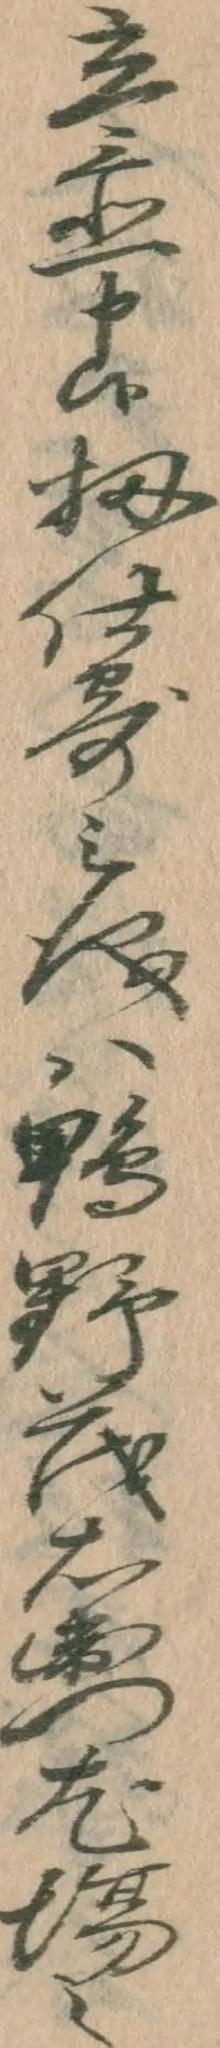立置申候扨仕寄之儀は鴨野茂右衛門尤場之
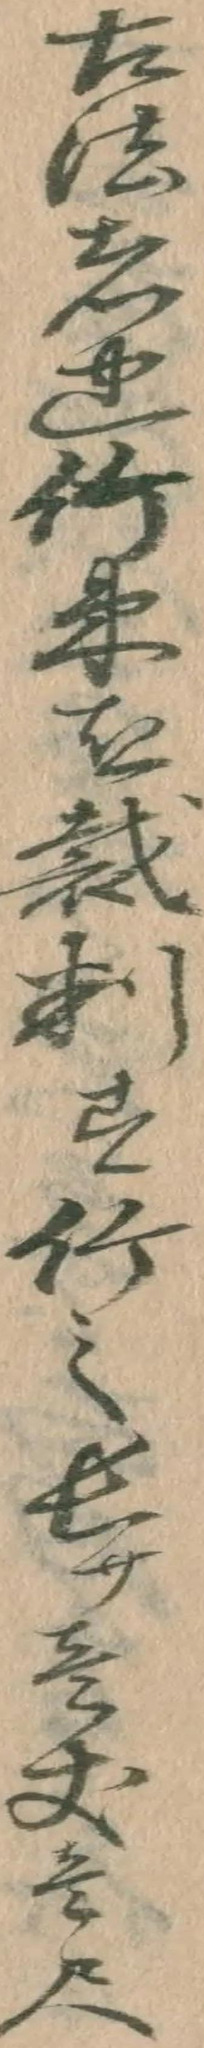左法者迚竹束を裁判春竹之長さ壱丈壱尺
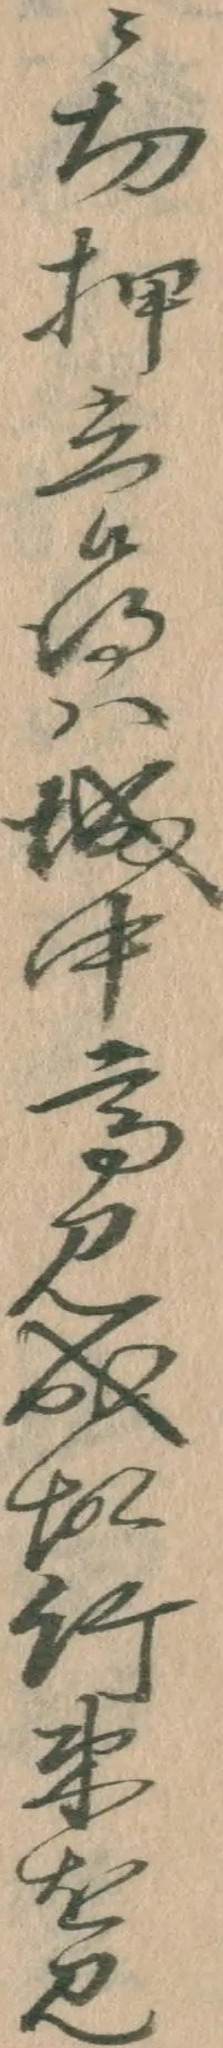に切押立候得は城中高見成故竹束を見
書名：切支丹御退治記 49巻. [5]
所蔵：国立国会図書館 National Diet Library, JAPAN
